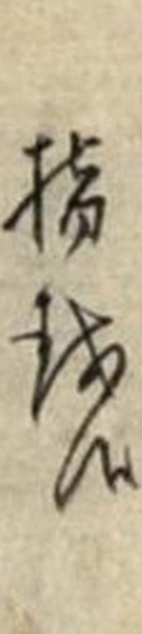指越候
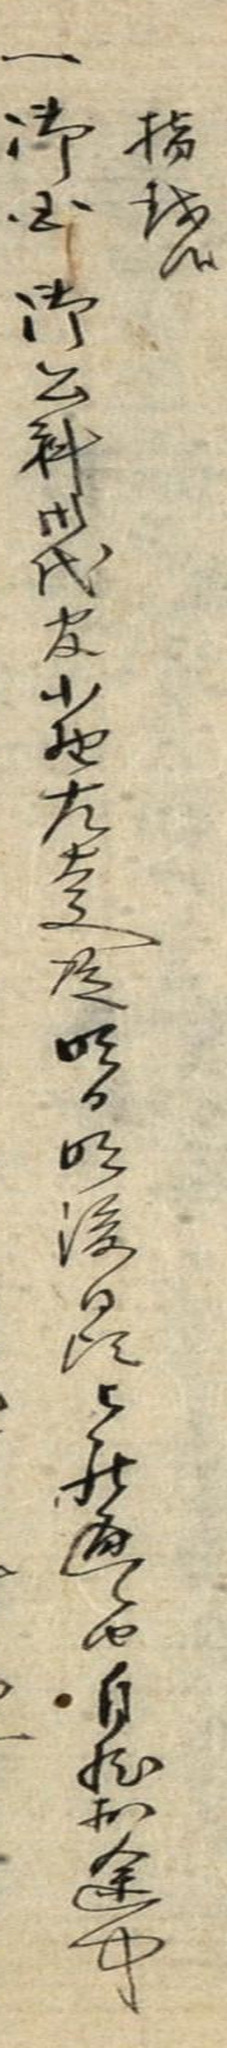一御国御公料御代官小野左太夫殿明日明後日頃被罷通候由自然於途中
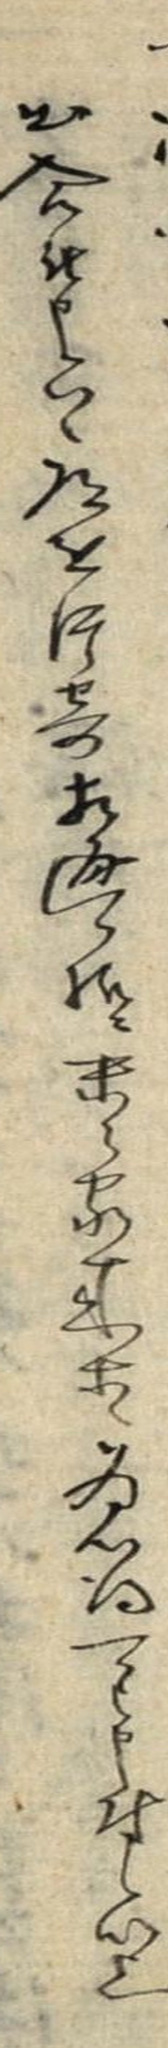出合被申候はゝ道を片寄相通候様に末々家来等へ為心得可被申付候以上

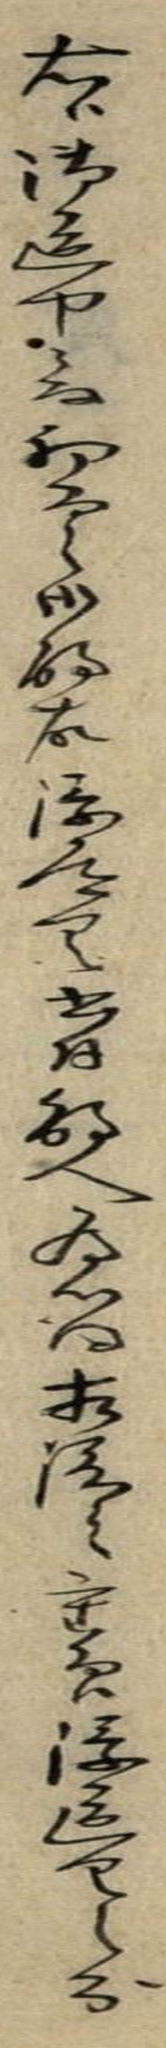右は御道中にて初て之御触故浮道具書付触人為心得相渡之重ては浮道具之分
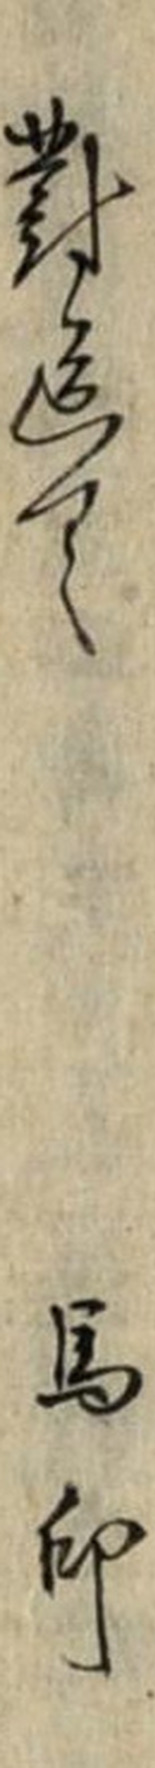対道具馬印
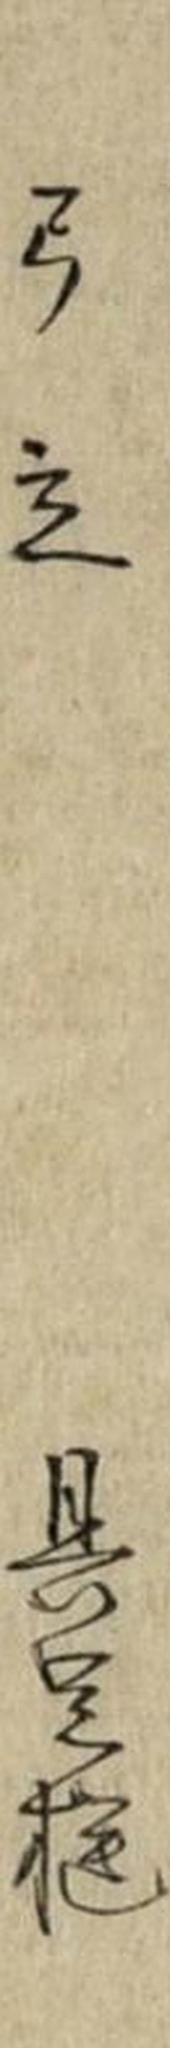弓立具足櫃
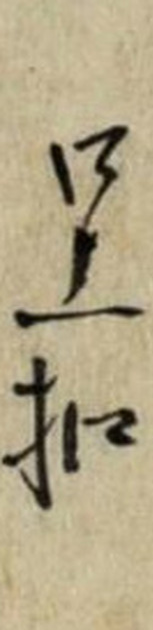口上扣
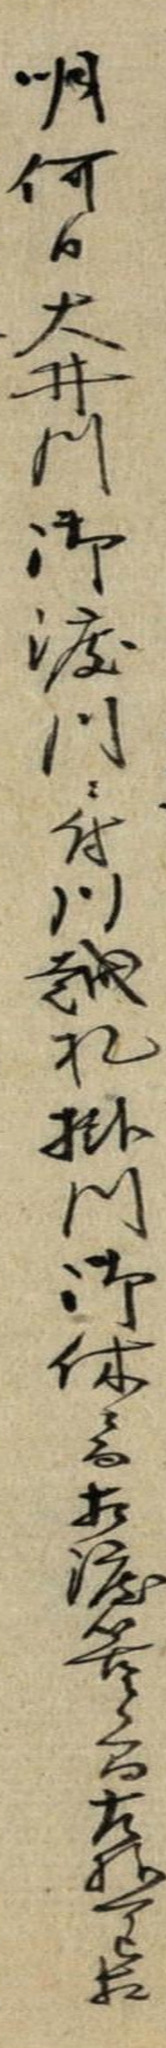明何日大井川御渡川に付川越札掛川御休にて相渡筈に候間左様可被相
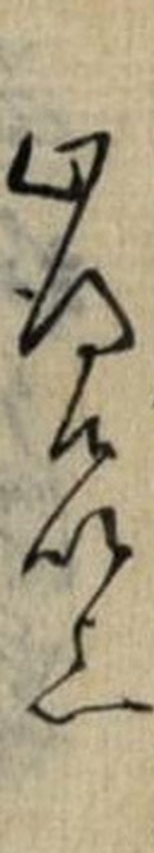心得候以上
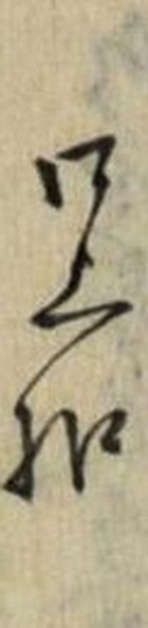口上扣
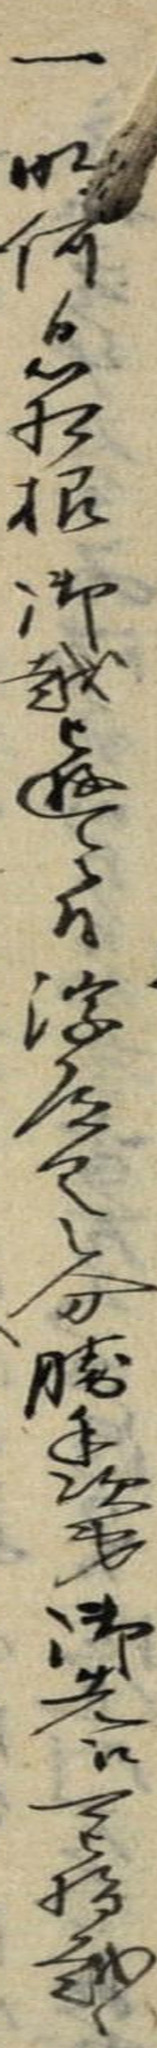一明何日箱根御越被遊候に付浮道具之分勝手次第御先江可被指越候
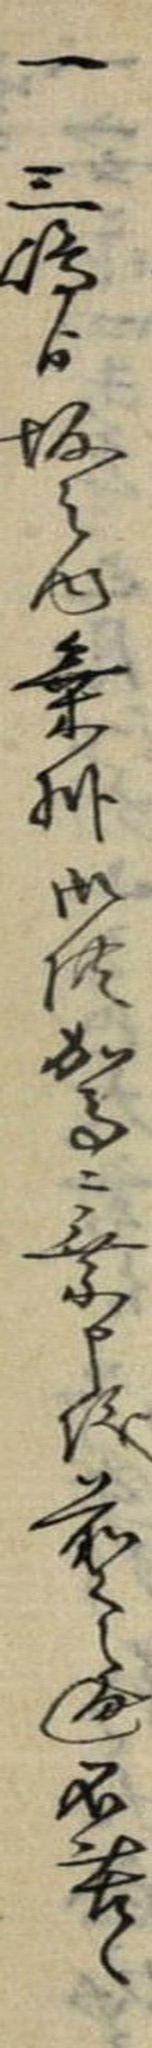一三嶋ゟ坂之内乗掛御供駕に乗申儀前々之通不苦候
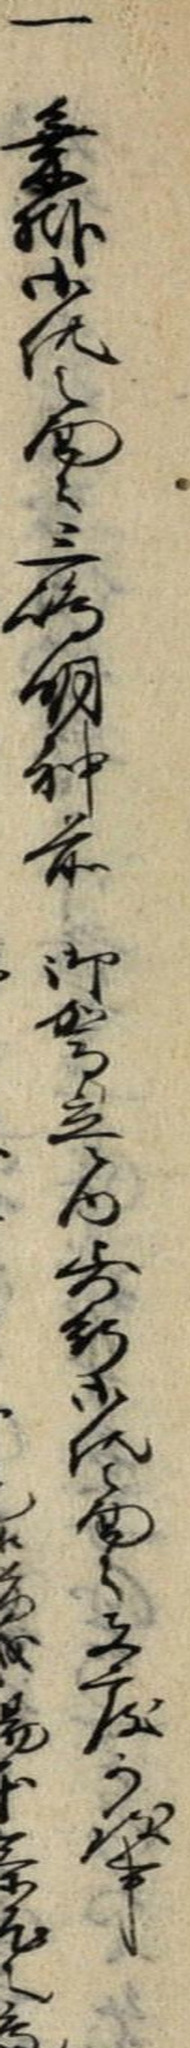一乗掛御供之面々三嶋明神前御駕立候内歩行御供之面々支度可致事
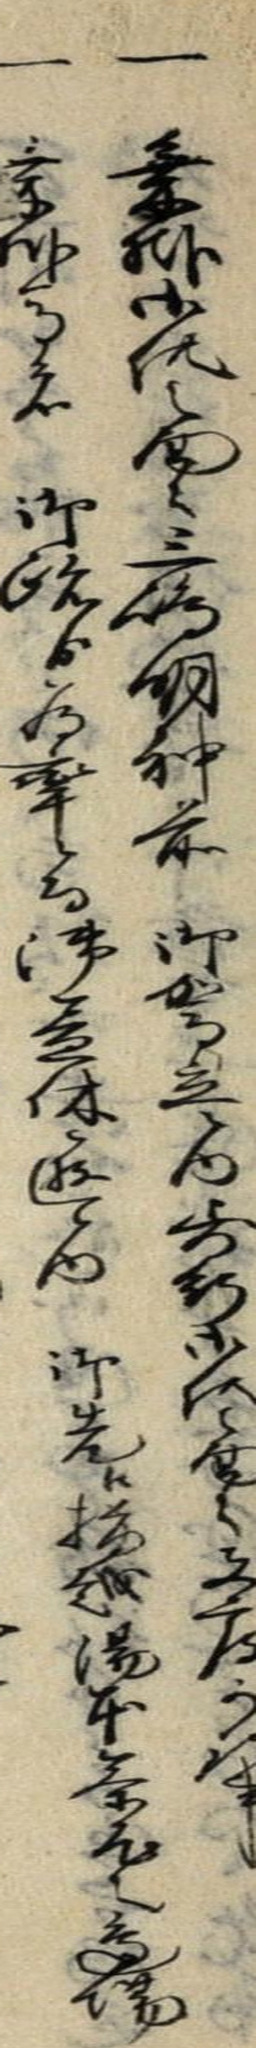一乗掛馬は御跡ゟ為牽候て御昼休被遊候内御先江指越湯本茶屋之辺場
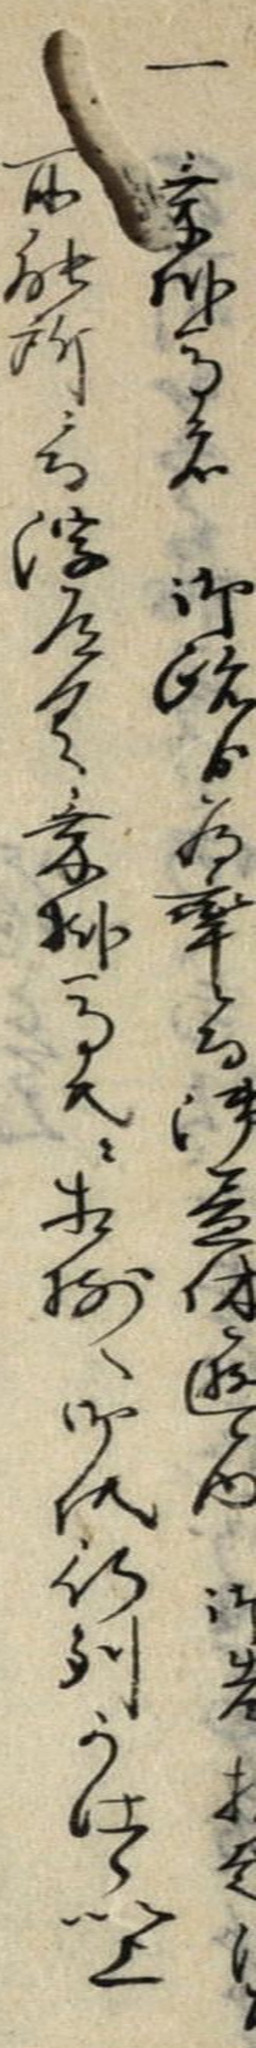所能所にて浮道具乗掛馬共に相揃へ御供行列可仕候以上
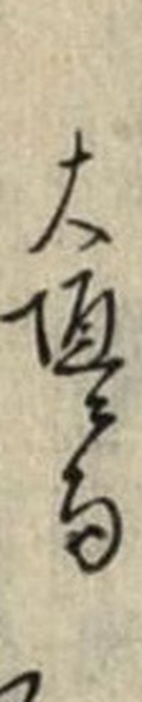大垣にて
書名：三都并道中之部
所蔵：福井県文書館 Fukui Prefectural Archives
